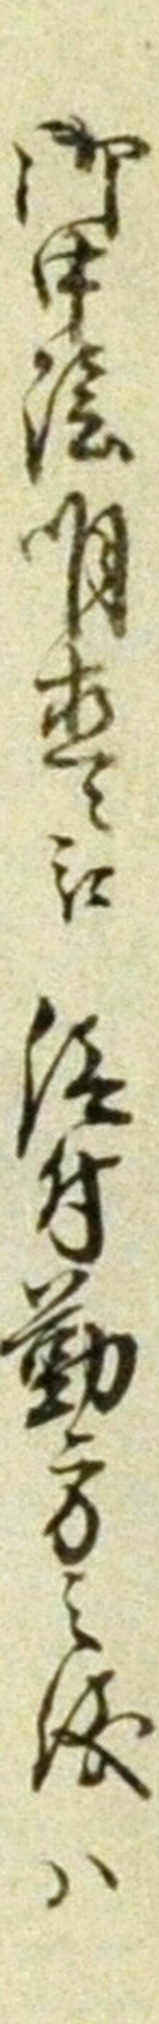御中陰明直ニ被仰付勤方之儀ハ
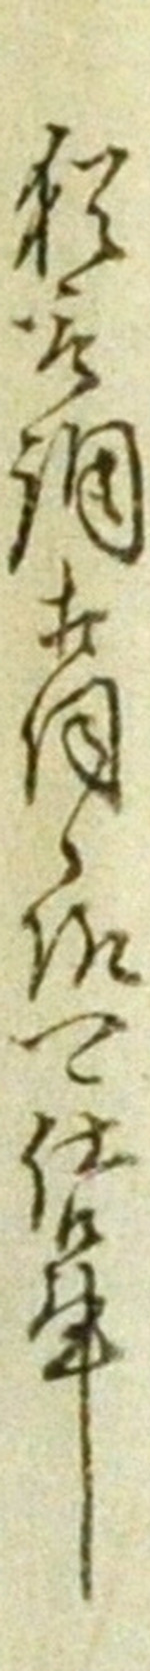猶取調相伺候様可仕候事
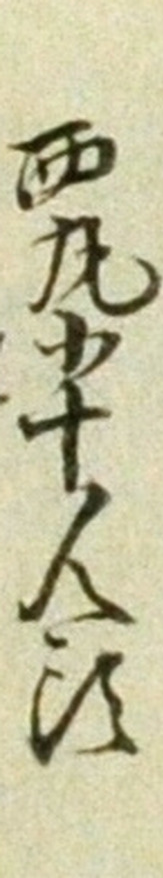西丸小十人頭
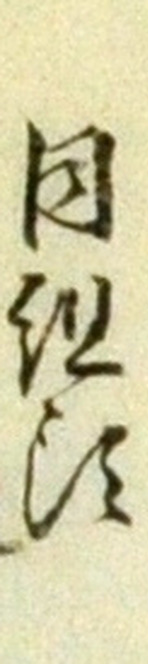同組頭
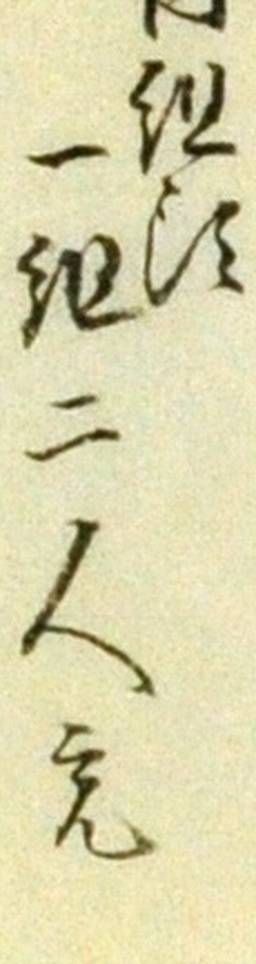一組二人充
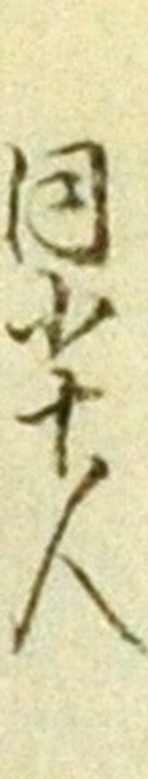同小十人
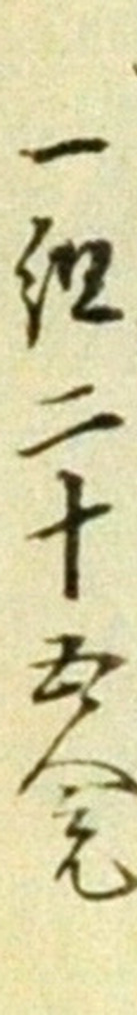一組二十五人充
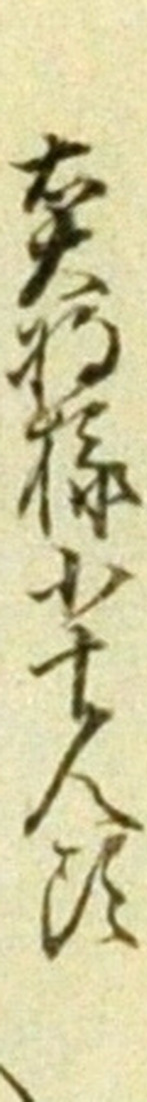右大将様小十人頭
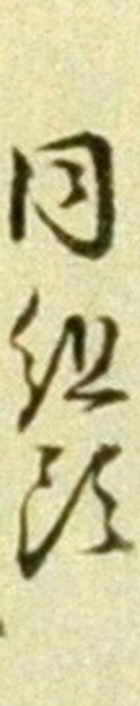同組頭
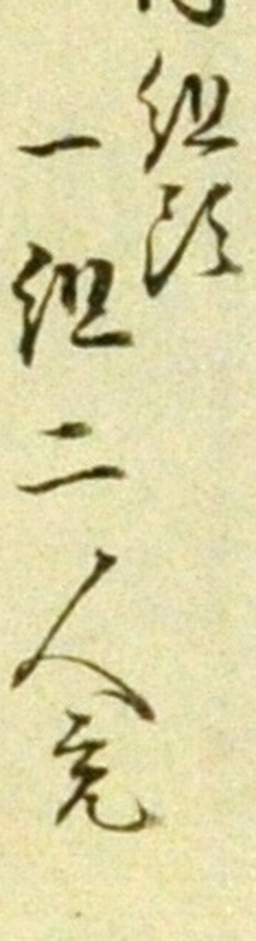一組二人充
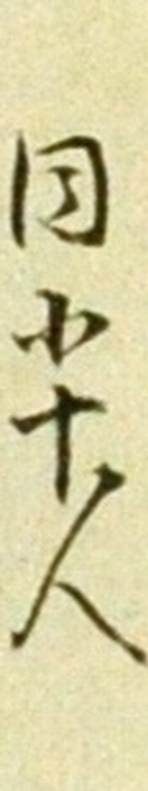同小十人
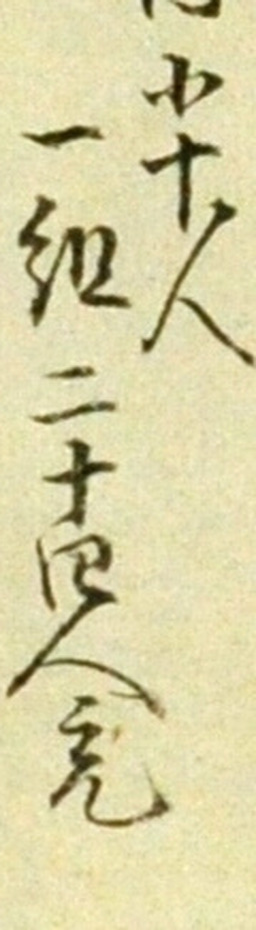一組二十四人充
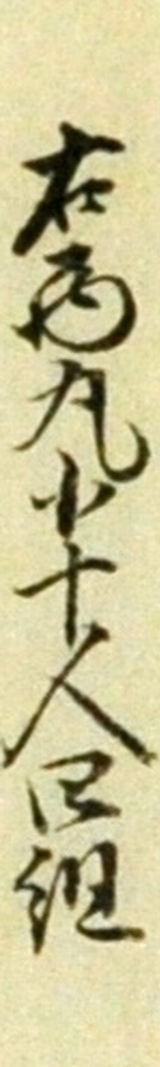右西丸小十人四組
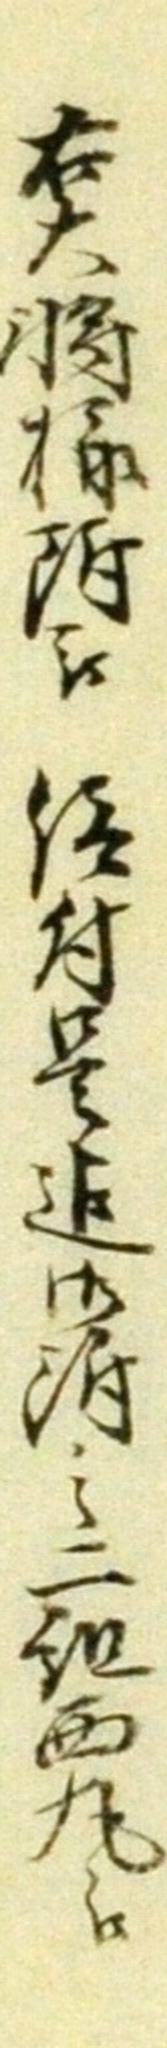右大将様附被仰付是迄御附之二組西丸江
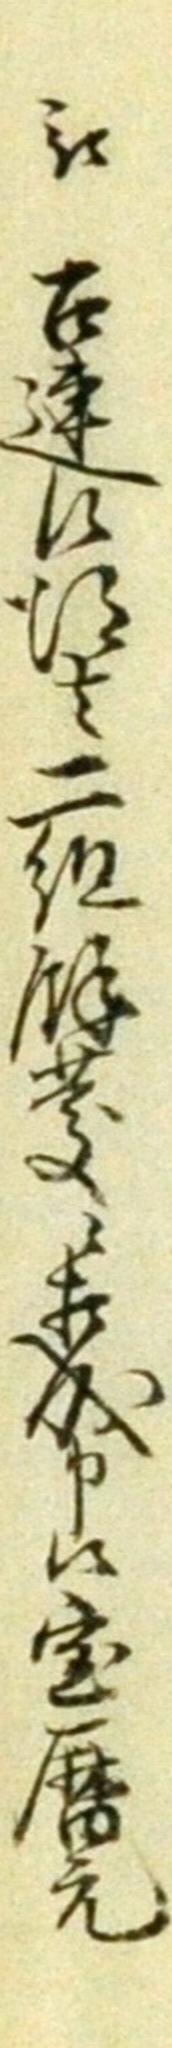被召連候得者二組餘慶ニ相成申候宝暦元
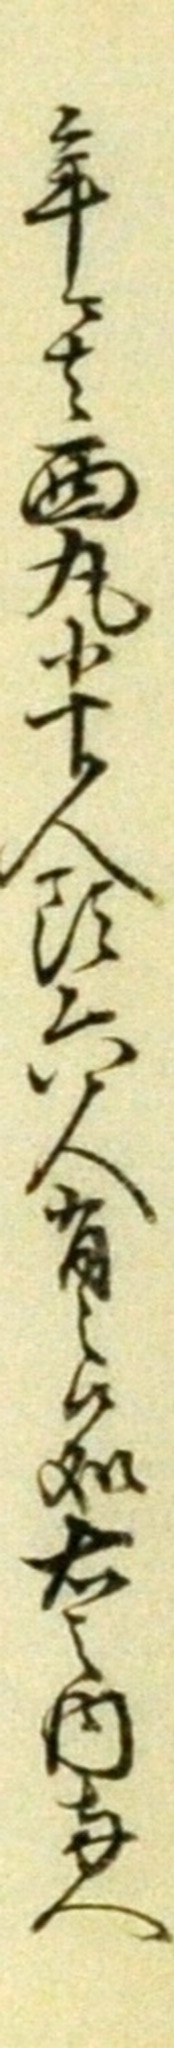年ニ者西丸小十人頭六人可有之候処右之内両人
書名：若年寄御役中御調書付
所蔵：伊那市立高遠町図書館・合同会社AMANE
